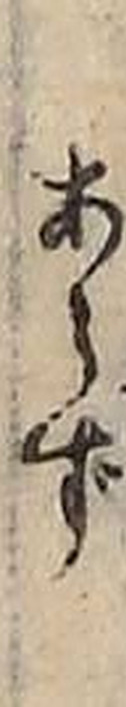あらず

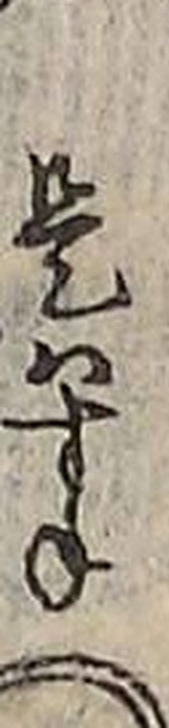是はすね
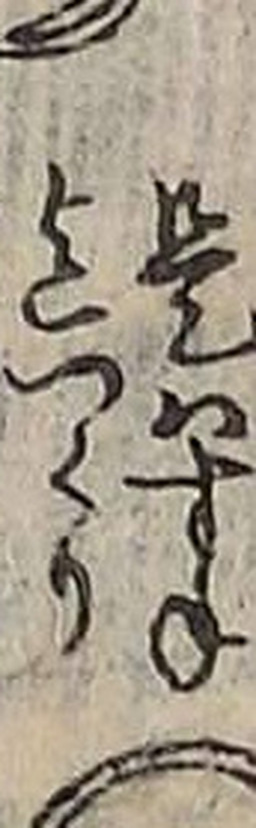迄つくり
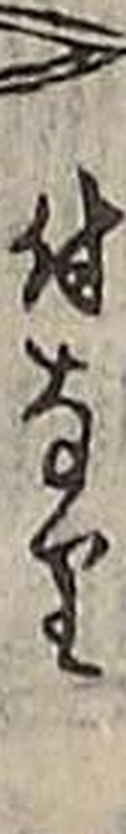付なり
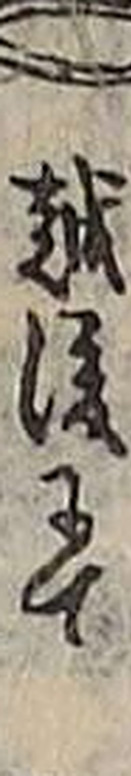越後にて
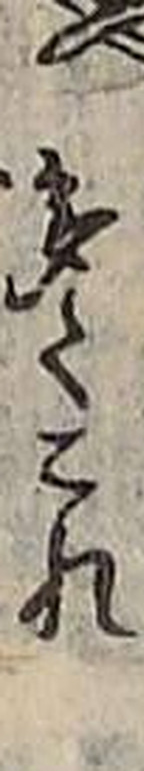多くこれ
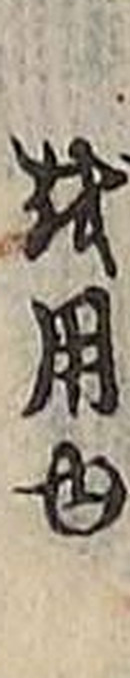を用ゆ
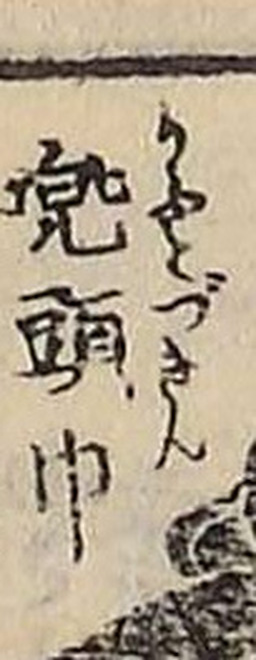兜頭巾
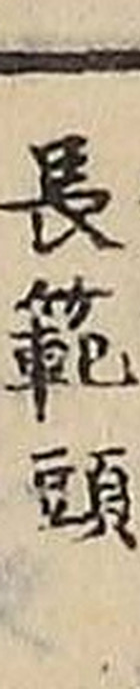長範頭
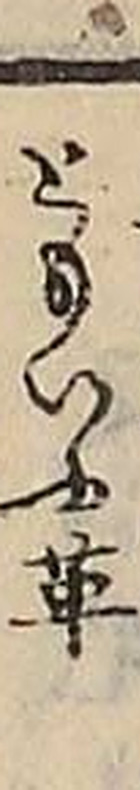ともいふ革
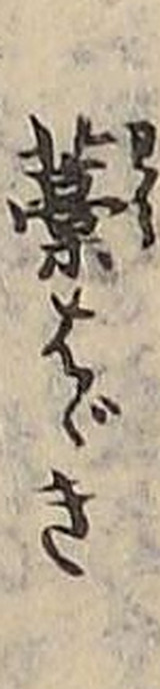藁はゞき
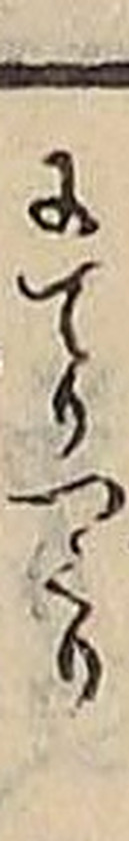にてりつくり
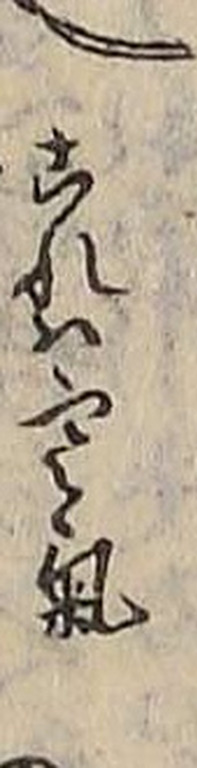これは寒気
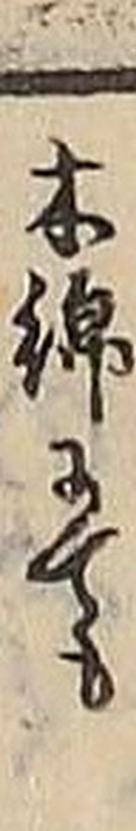木綿にても
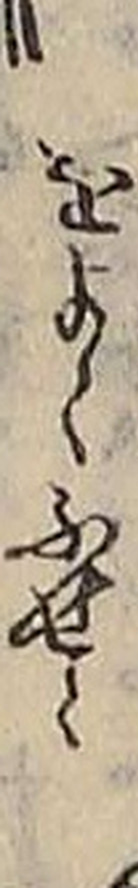をよくふせく
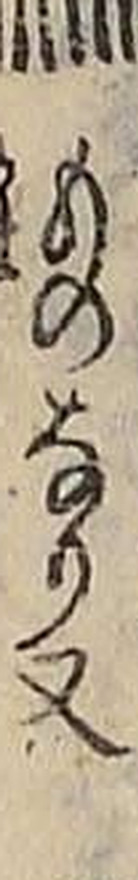ものなり又
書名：旅行用心集
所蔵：神戸大学附属図書館 国文学研究資料館
